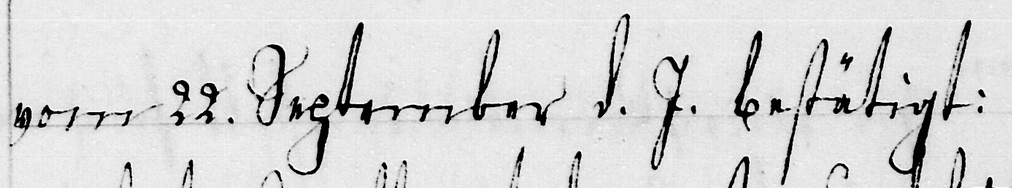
vom 22. September d. J. bestätigt:
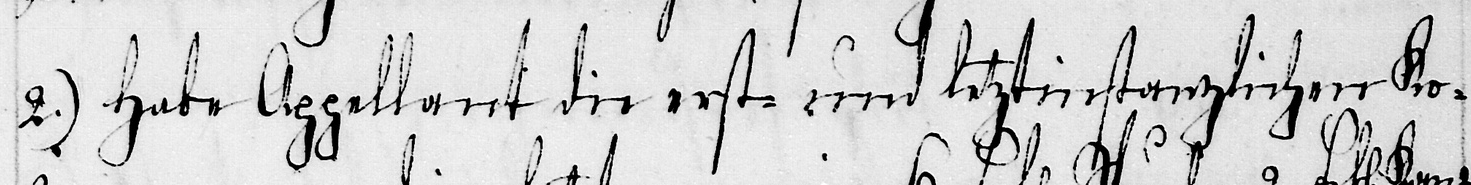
2.) habe Appellant die erst- und letztinstanzlichen Ko¬
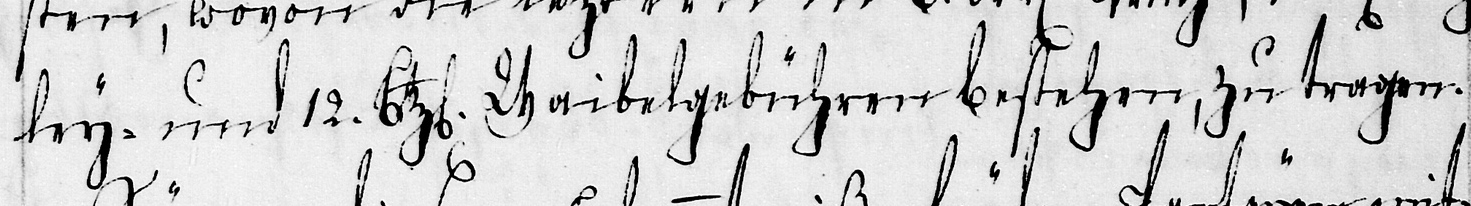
ley- und 12. Btz[en]. Waibelgebühren bestehen, zu tragen.
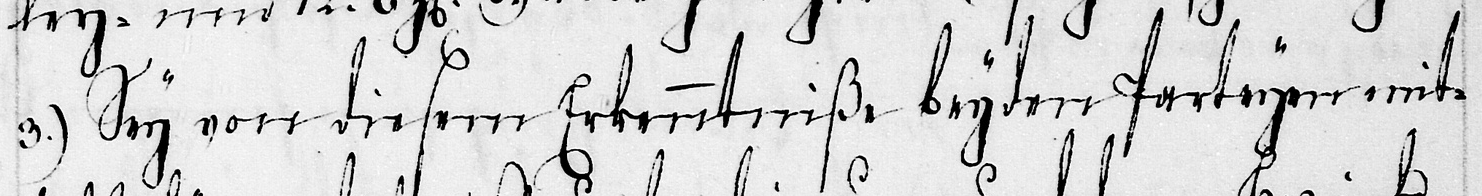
3.) Sey von diesem Erkenntniße beyden Parteyen mit¬
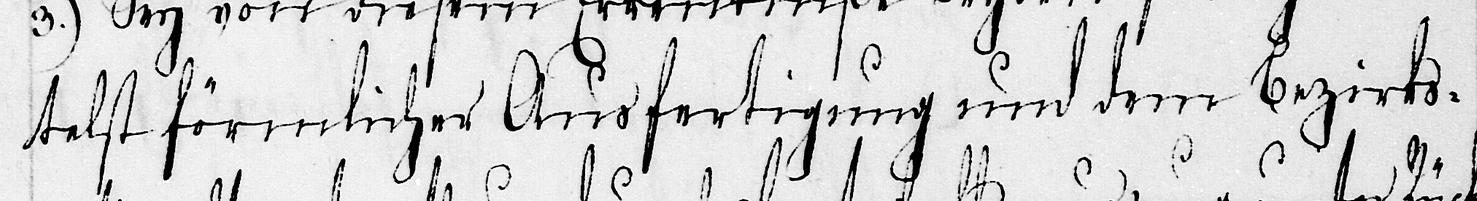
telst förmlicher Ausfertigung und dem Bezirks¬
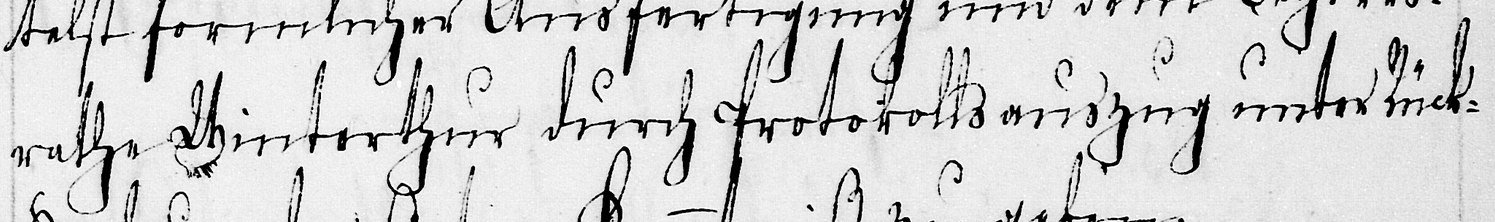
rathe Winterthur durch Protokollsauszug unter Rück¬
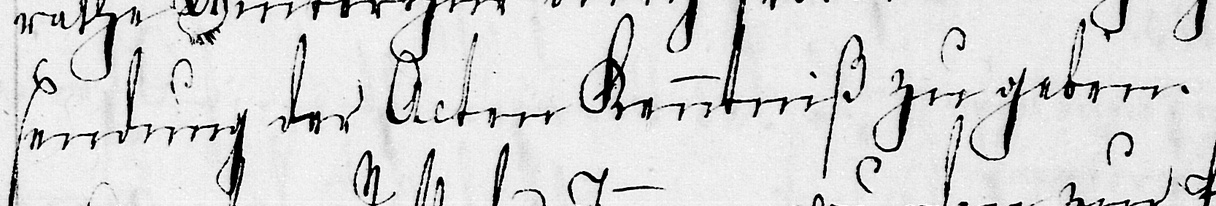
sendung der Acten Kenntniß zu geben.
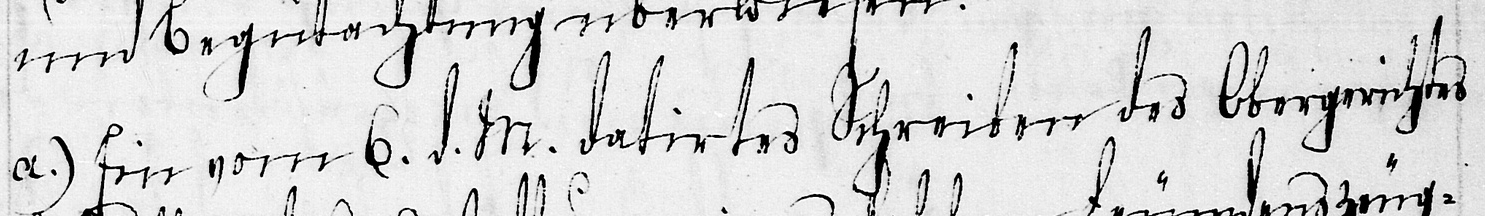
a.) Ein vom 6. d. M. datirtes Schreiben des Obergerichtes
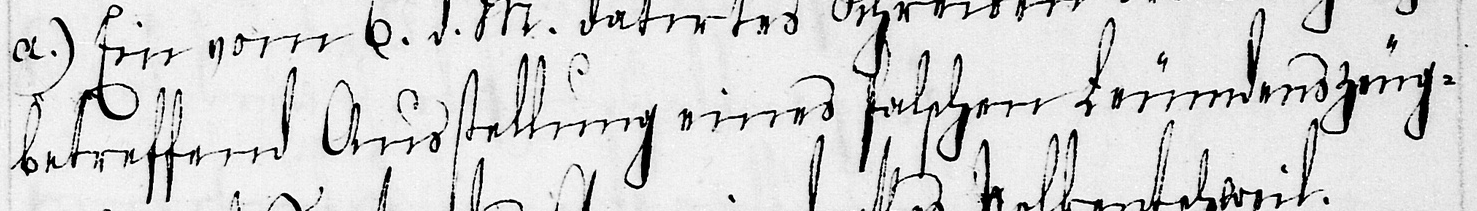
betreffend Ausstellung eines falschen Leumdenszeug¬
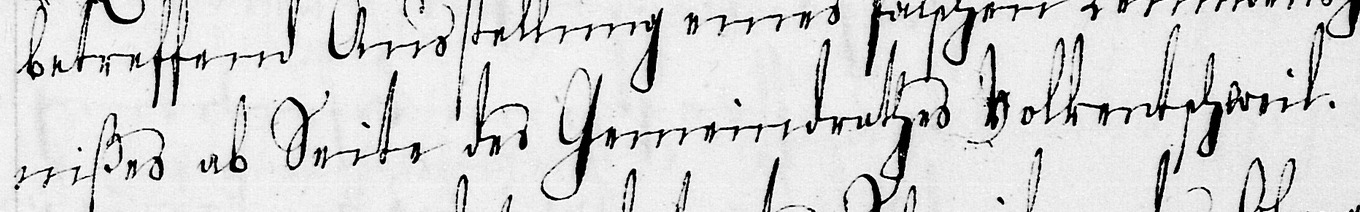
nißes ab Seite des Gemeindrathes Volkentschweil.
